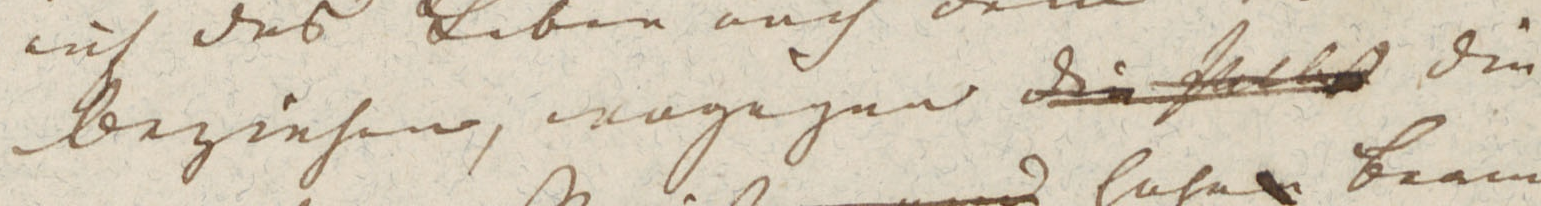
beziehen, wogegen die Palbst die
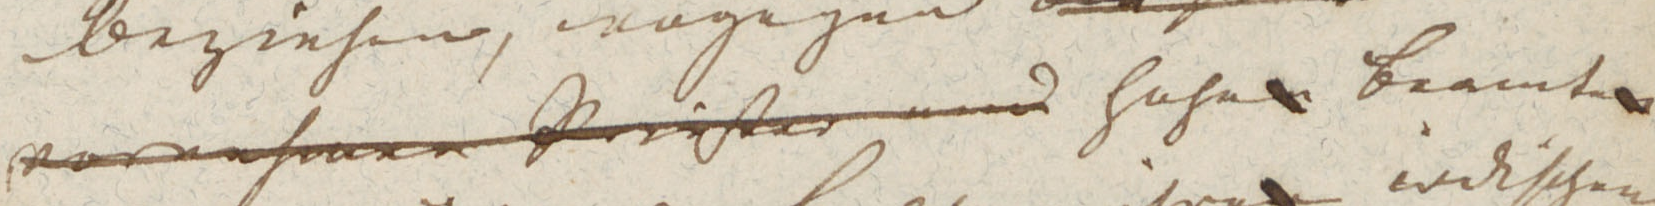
vornehmen Priester und hohen Beamten
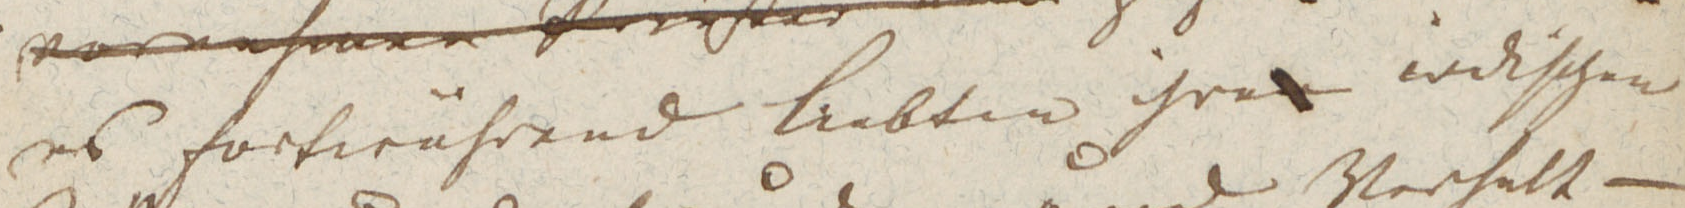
es fortwährend liebten ihrer irdischen
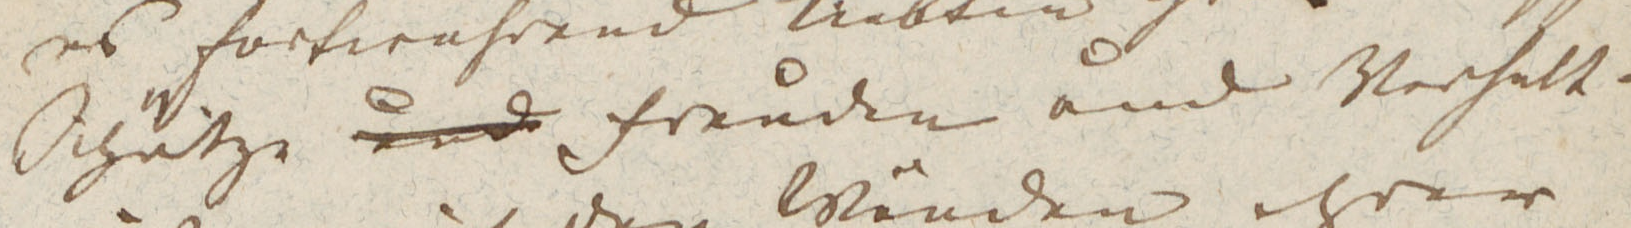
Schätze und Freuden und Verhalt-
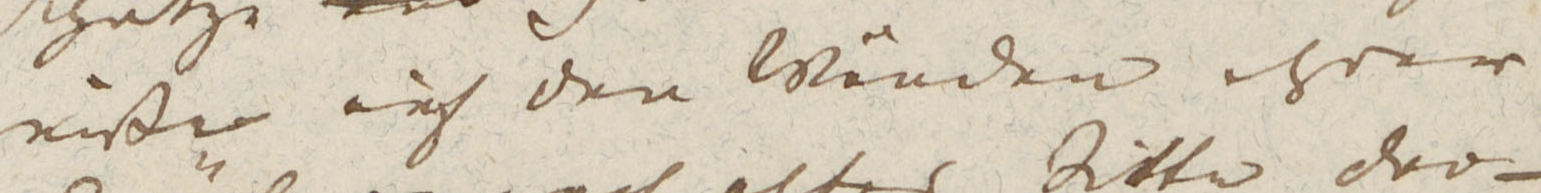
nisse auf den Wänden ihrer
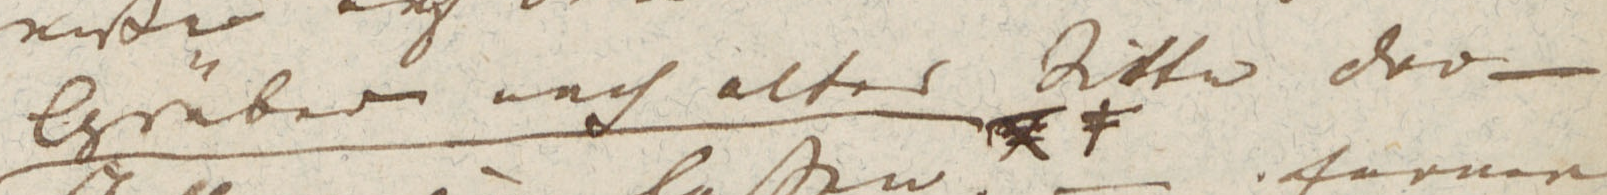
Gräber nach alter Sitte dar-
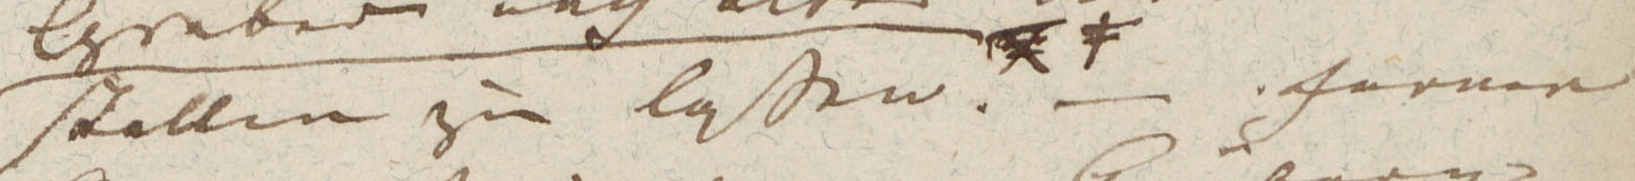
stellen zu lassen. %% – . Ferner
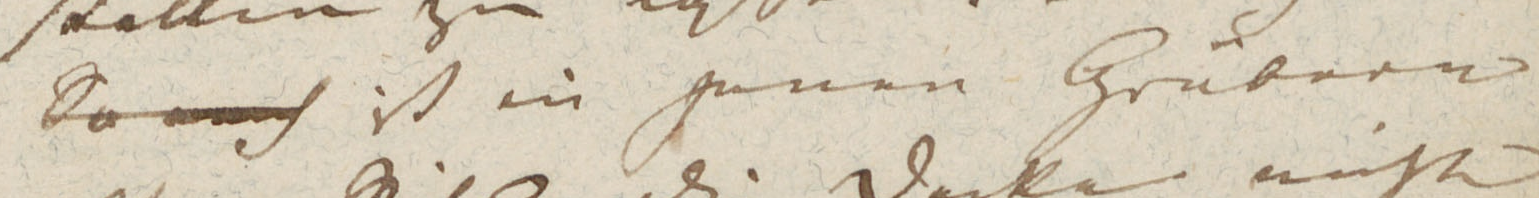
So auch ist in jenen Gräbern
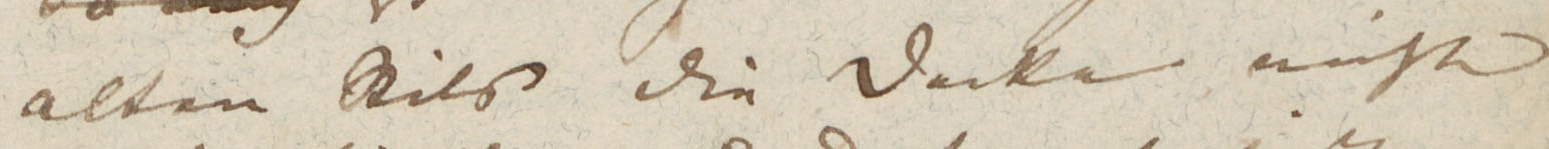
alten Stils die Decke nicht
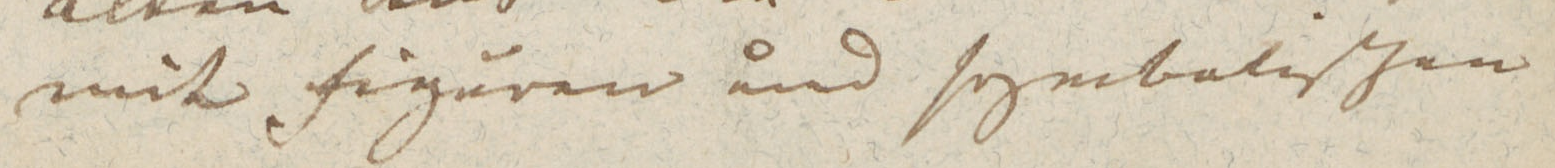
mit Figuren und symbolischen
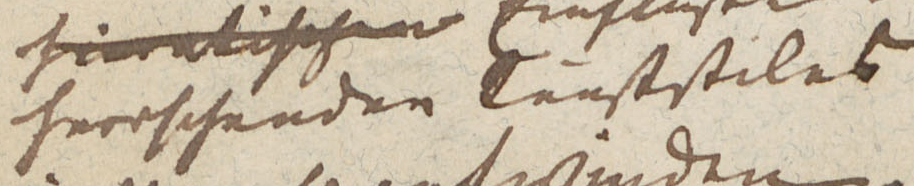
herrschenden Kunststiles
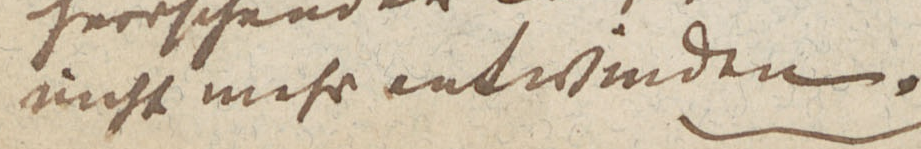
nicht mehr entwinden.
